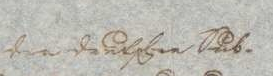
der deutschen Sub-
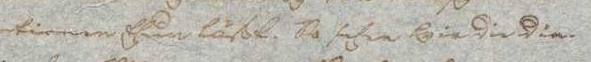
ventionen thun läßt. So sehen wir die Din-
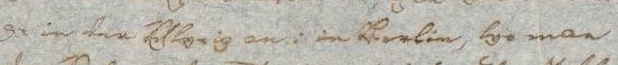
ge in der Schweiz an: in Berlin, wo man
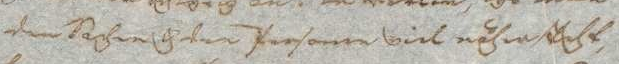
den Sachen & den Personen viel näher steht,
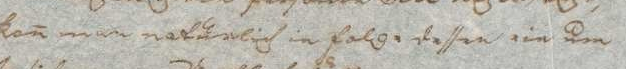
kann man natürlich in Folge dessen ein um
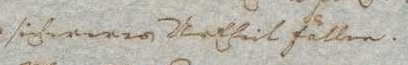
sichereres Urtheil fällen.
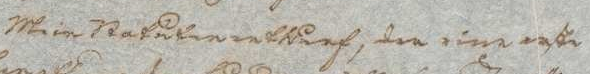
Mein Statutenentwurf, den eine erste
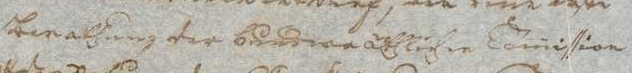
Berathung der bundesräthlichen Commission
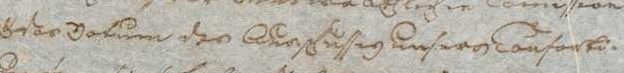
& das Votum des Ausschusses unsers Consorti-
